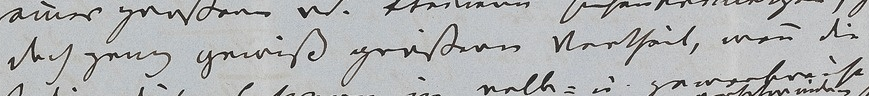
doch ganz gewiß größern Vortheil, wenn die
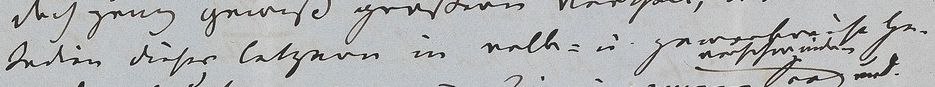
Radien dieser letztern in volk- u. gewerbreiche Ge-
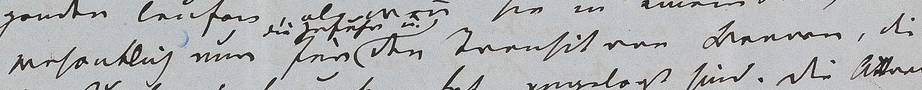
wesentlich nur für die Zufuhr u. den Transit von Waaren, die
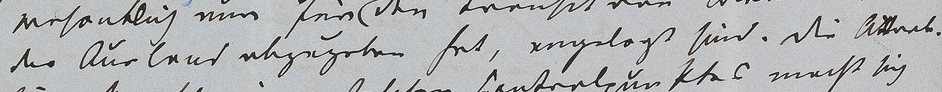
das Ausland abzugeben hat, angelegt sind. Die Attrak-
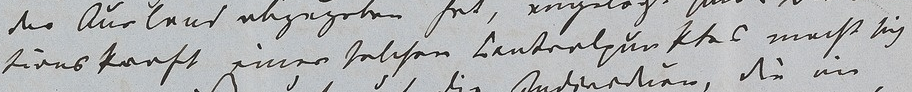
tionskraft eines solchen Centralpunktes macht sich
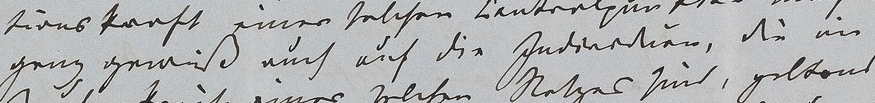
ganz gewiß auch auf die Individuen, die im
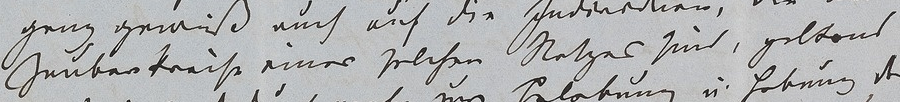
Zauberkreise eines solchen Netzes sind, geltend
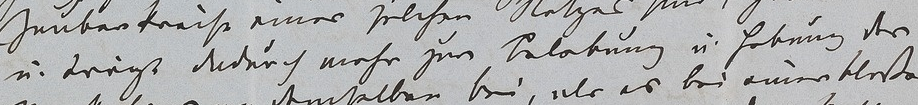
u. trägt dadurch mehr zur Belebung u. Hebung des
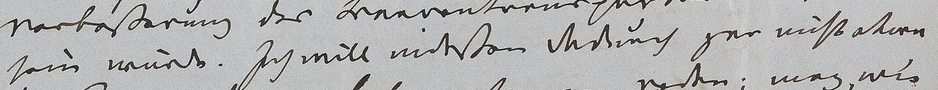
sein würde. Ich will indeßen dadurch gar nicht etwa
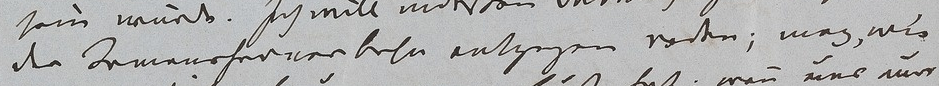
der Romanshornerbahn entgegen reden; mag, wie
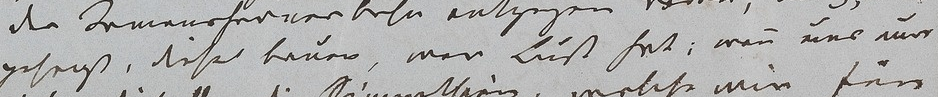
gesagt, diese bauen, wer Lust hat; wenn uns nur
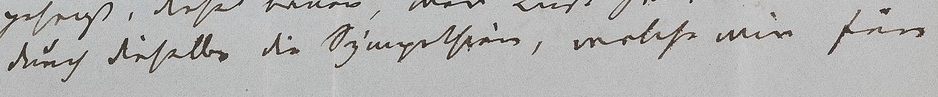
durch dieselbe die Sympathien, welche wir für
